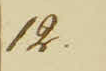12.
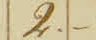2.
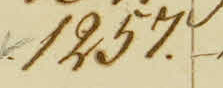1257.
